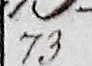73
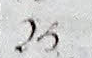25
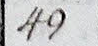49
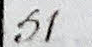51
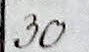30
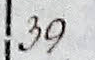39
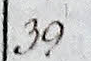39
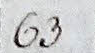63
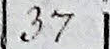37
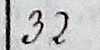32
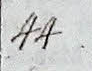44
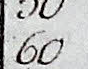60
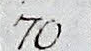70
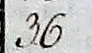36
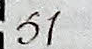51
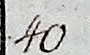40
